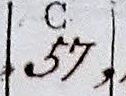57
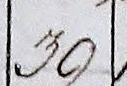39
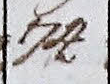74
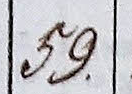59.
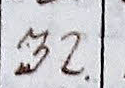32.
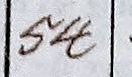54
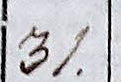31.
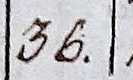36.
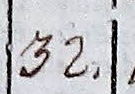32.
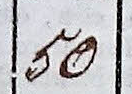50
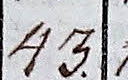43.
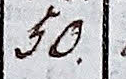50.
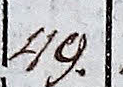49.
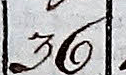36
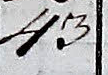43
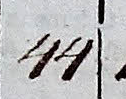44
